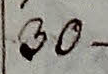30
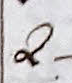2
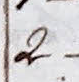2
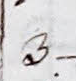3
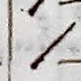1
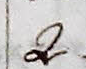2
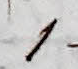1
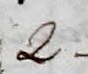2
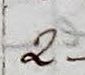2
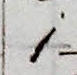1
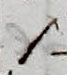1
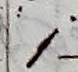1
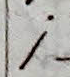1
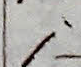1
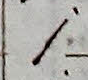1
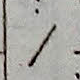1
